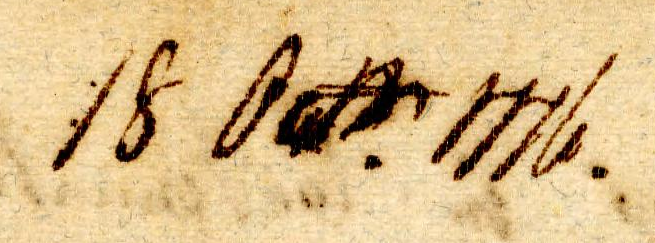18 Oc^r. 1776.
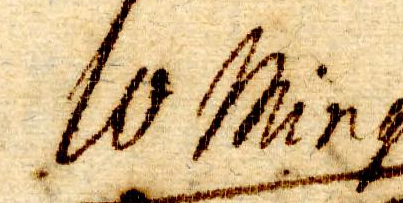W Mingo
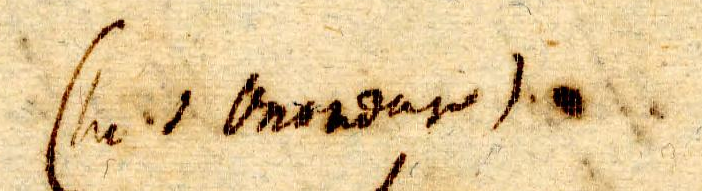(he is Onondaga)
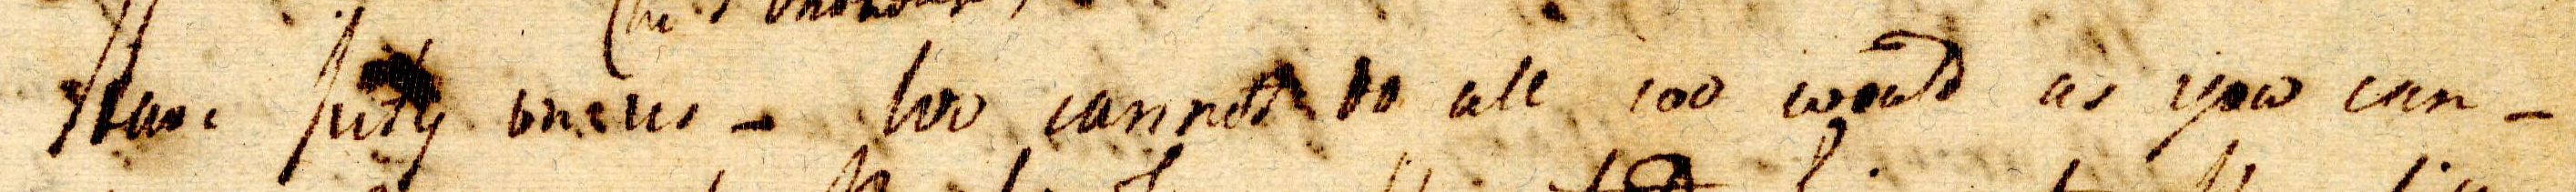Have pity one us- we cannot do all we would as you can-
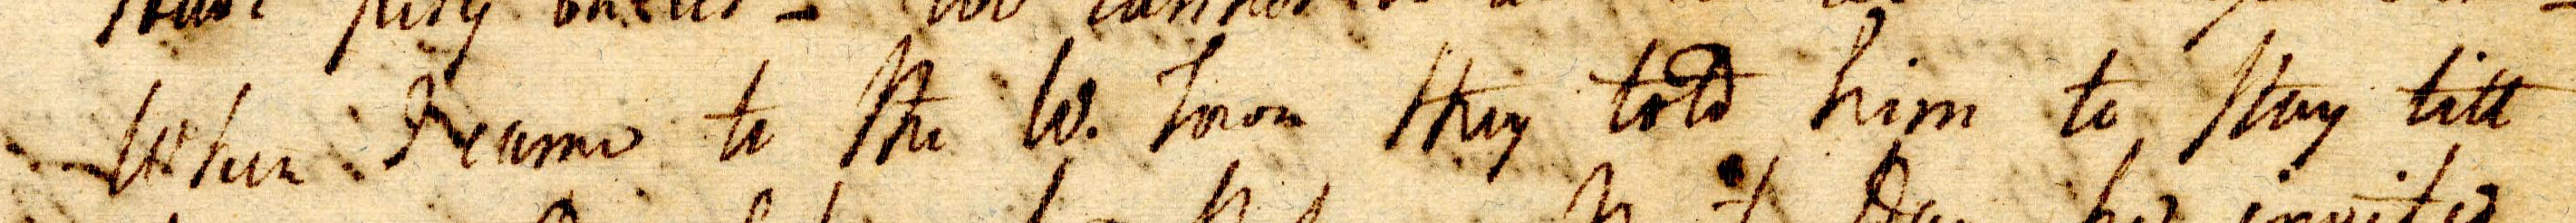Where I came to the W. Town they told him to stay till
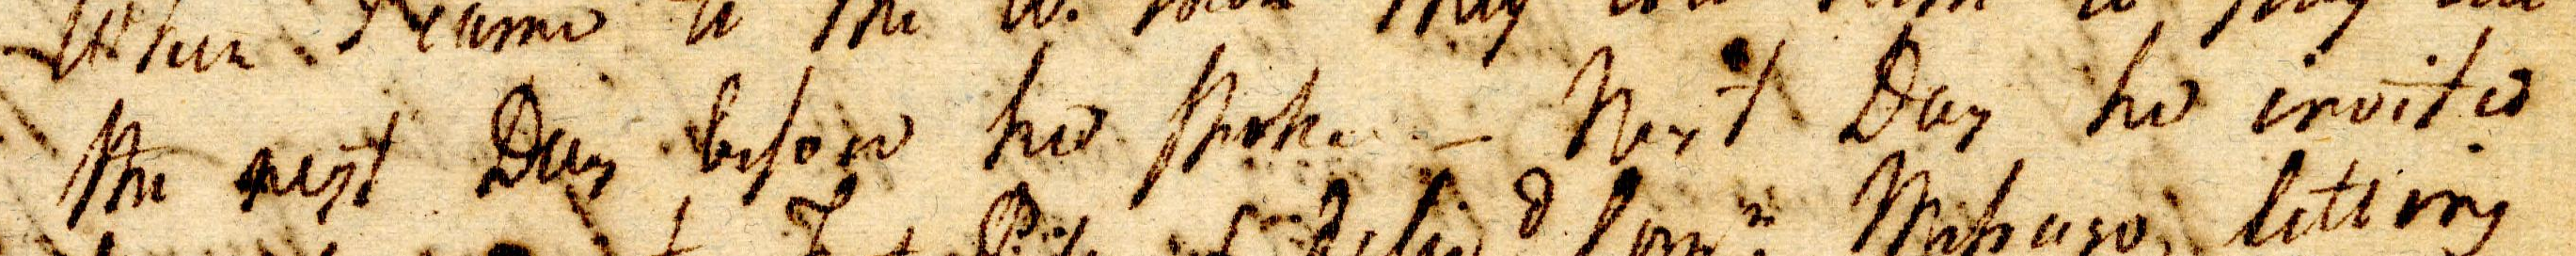the next Day before he spoke- Next Day he invited
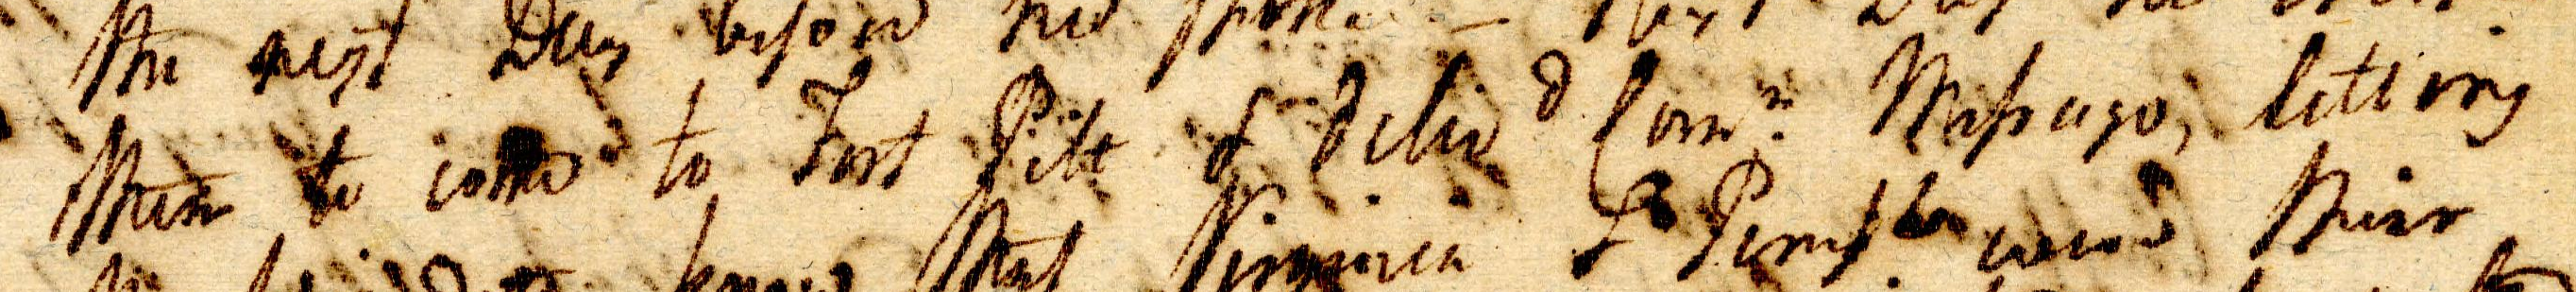them to come to Fort Pitt & deliv^d Com^r. Message, letting
